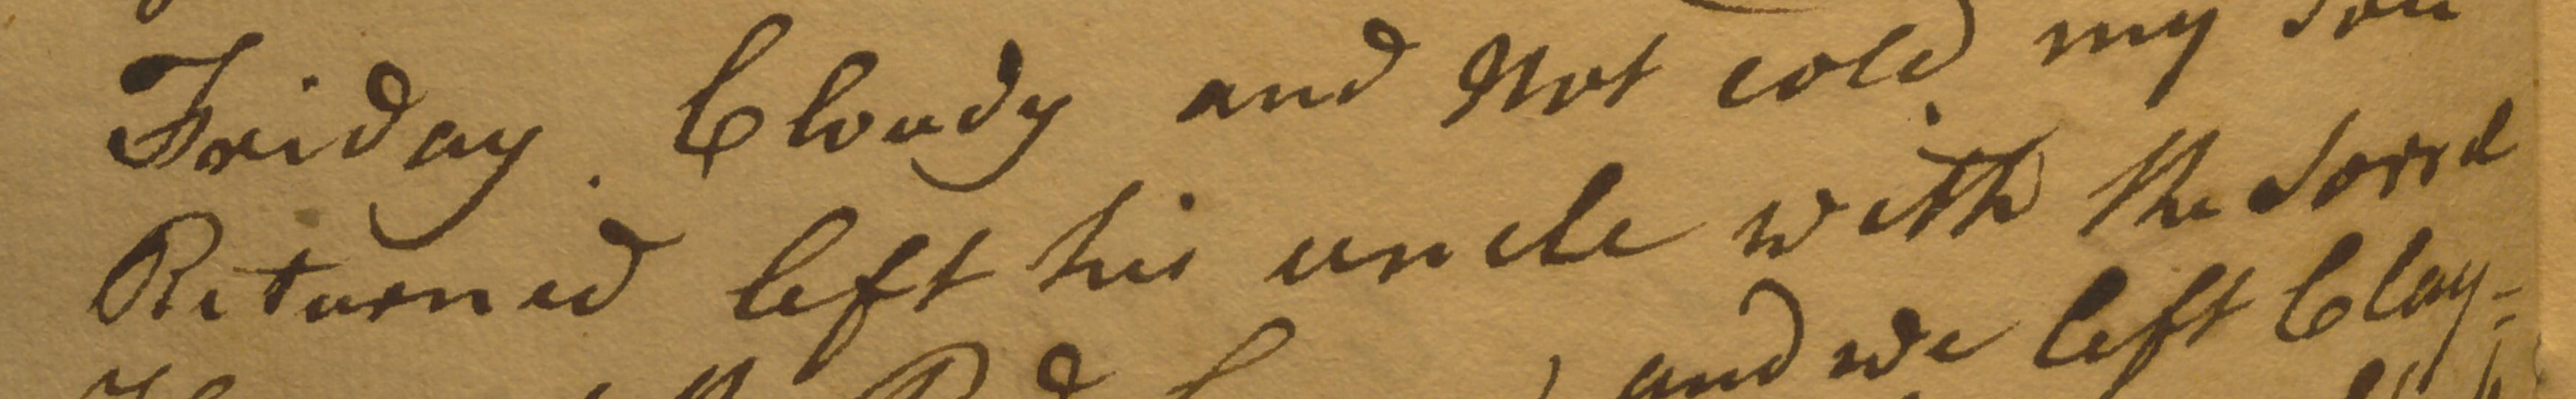Returned left his uncle with the Sorrel
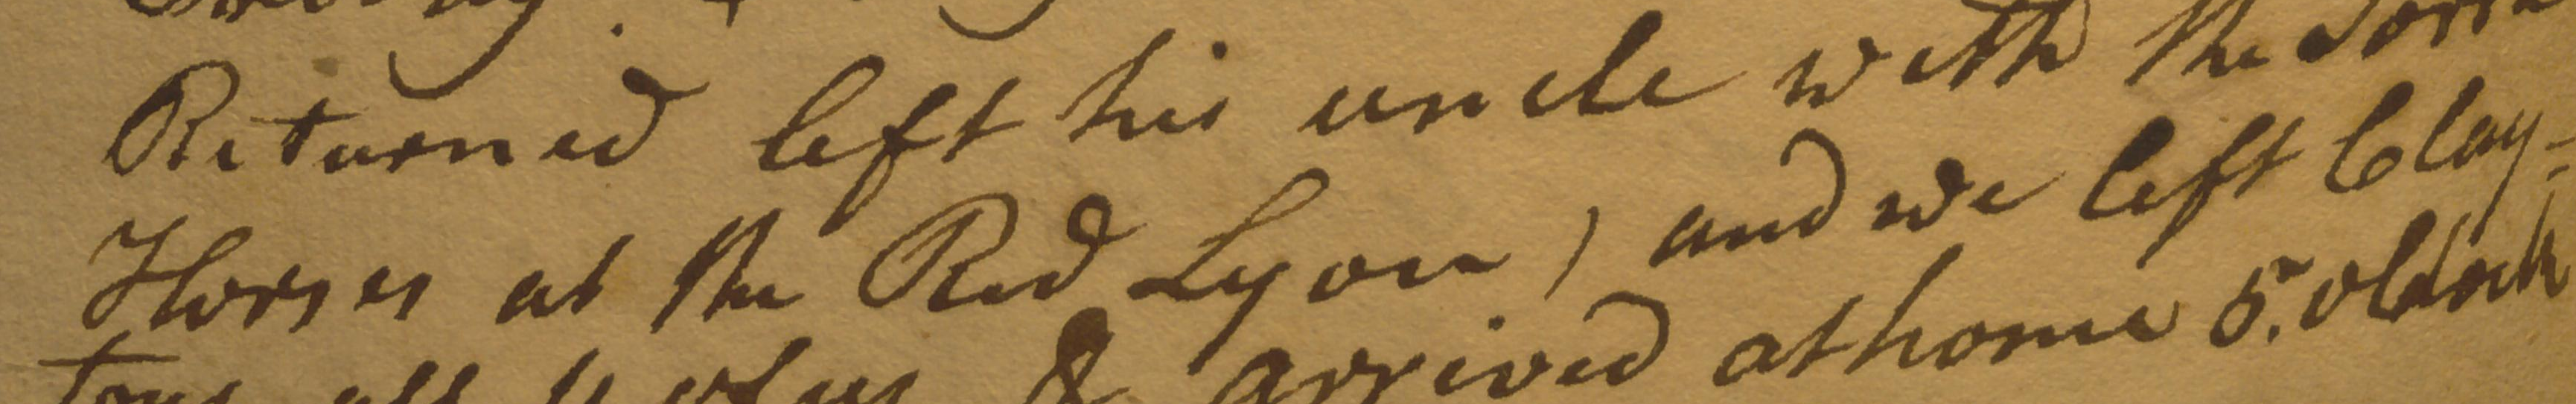Horses at the Red Lyon, and we left Clay-
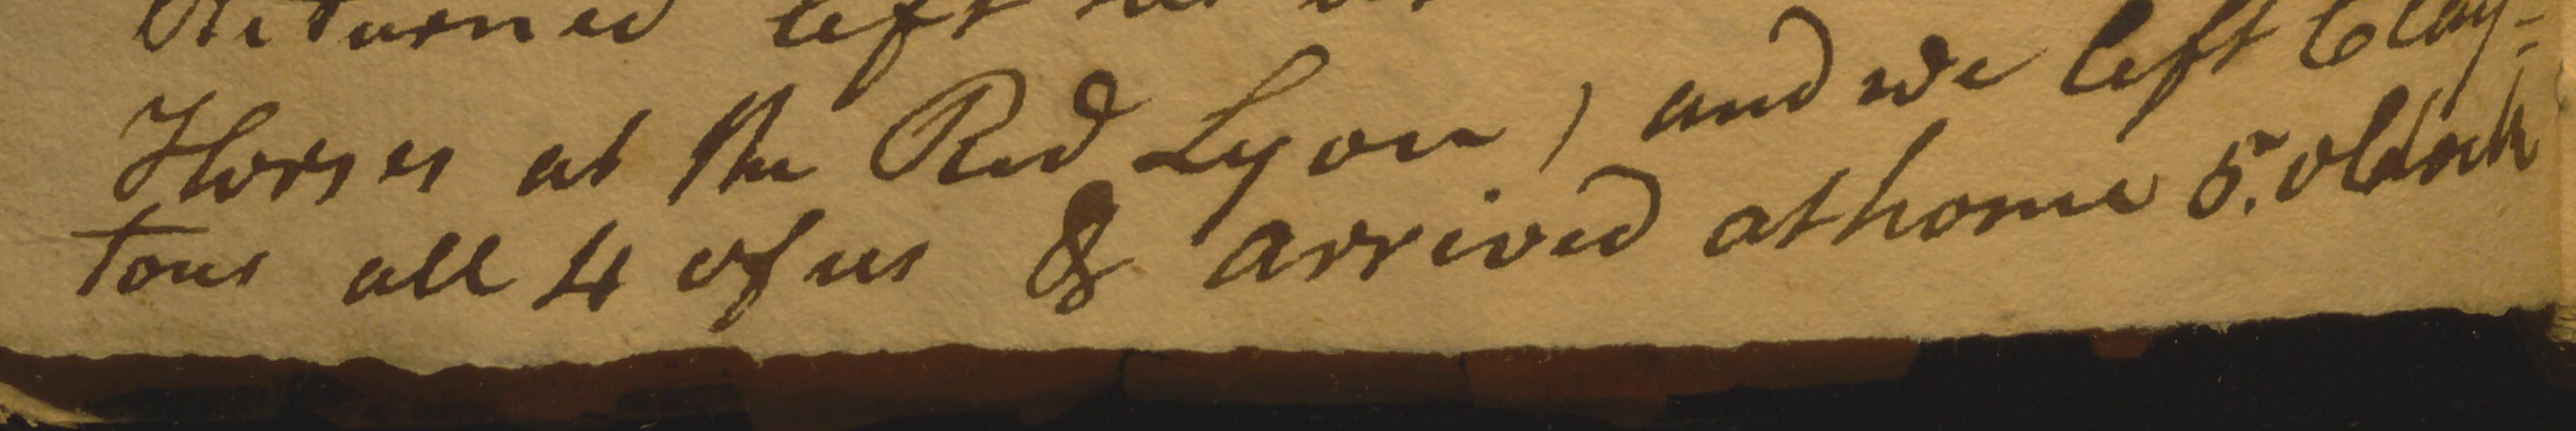tons all 4 of us & arrived at home 5 oClock
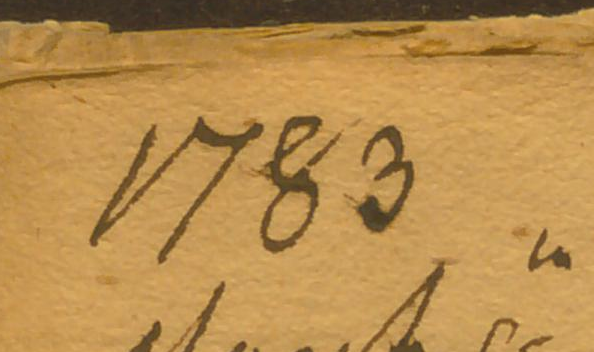1783
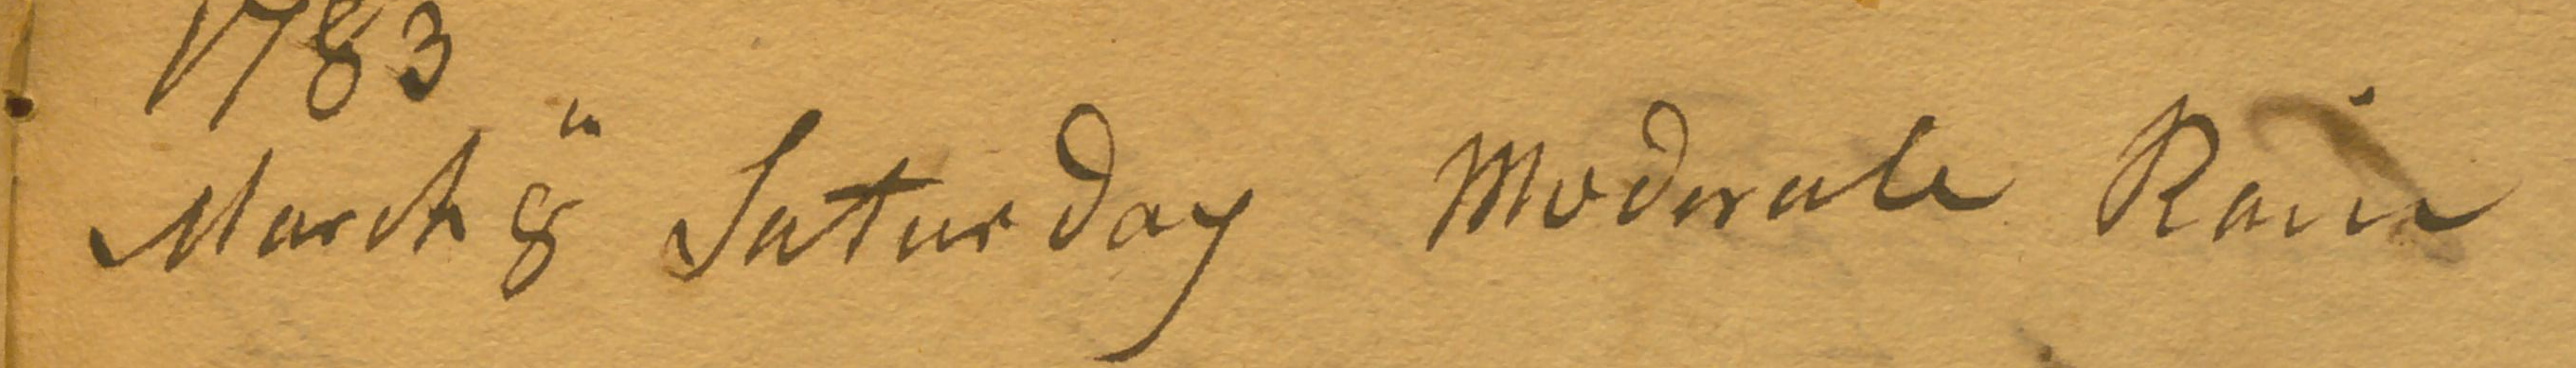March 8^th Saturday Moderate Rain
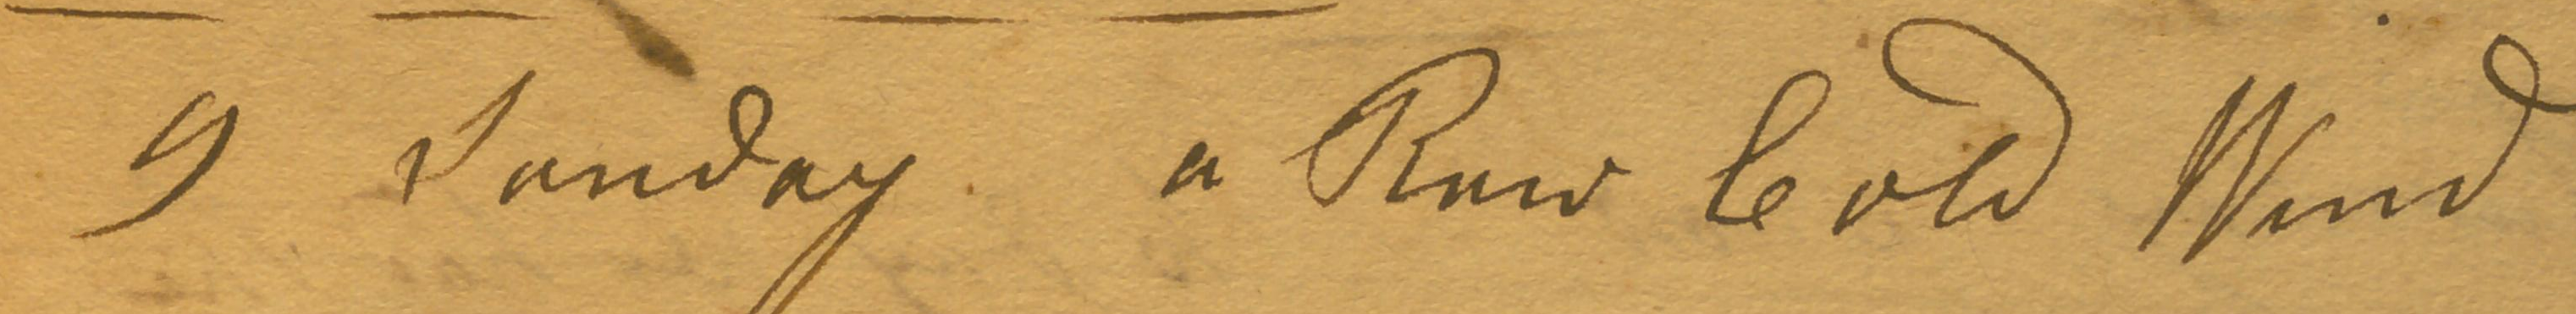9 Sunday. a Raw Cold Wind
